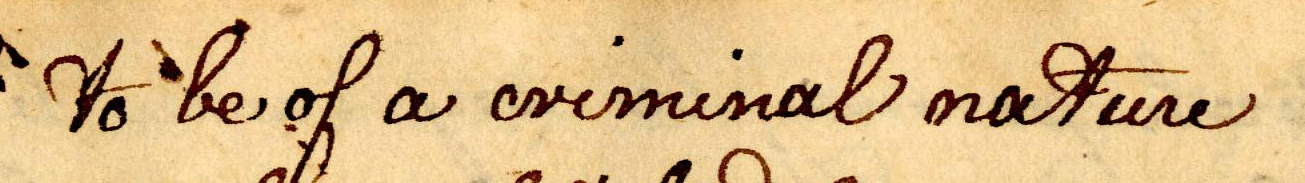to be of a criminal nature
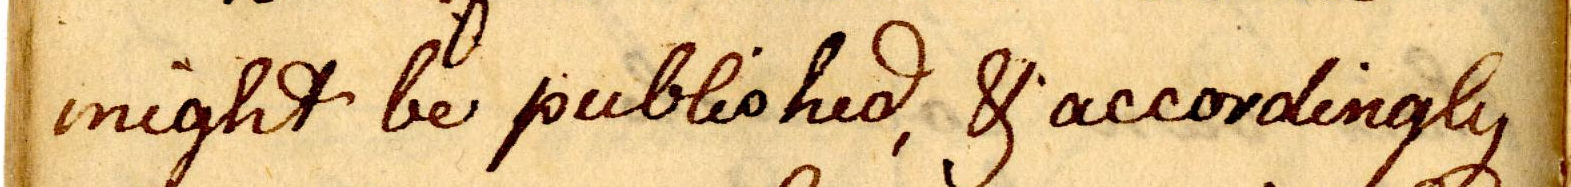might be published, & accordingly
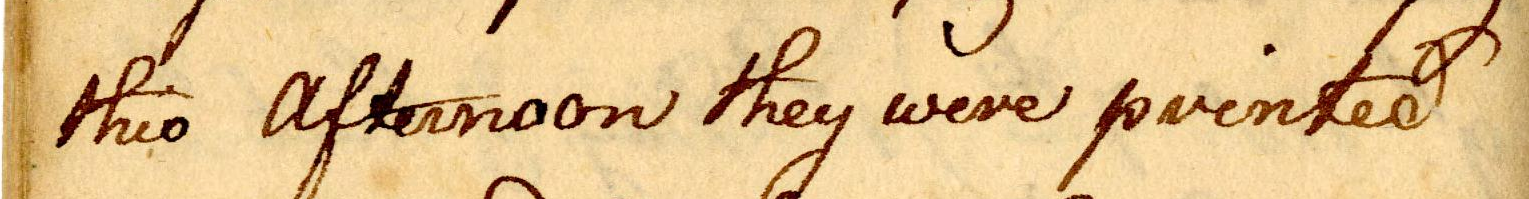this Afternoon they were printed
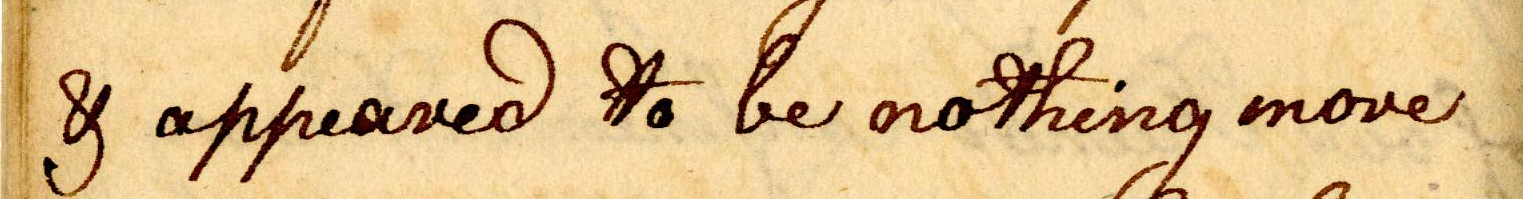& appeared to be nothing more
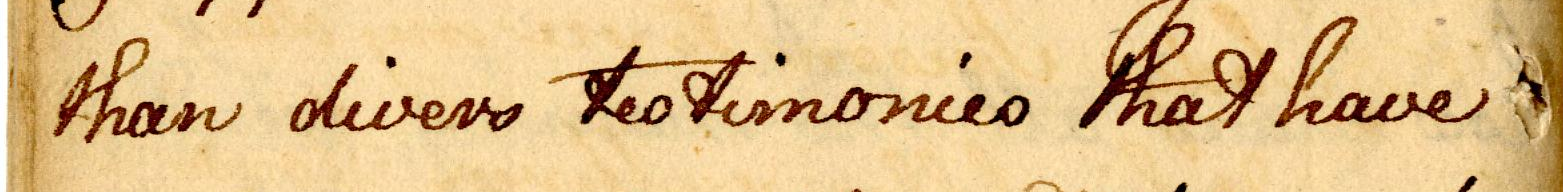than divers testimonies that have
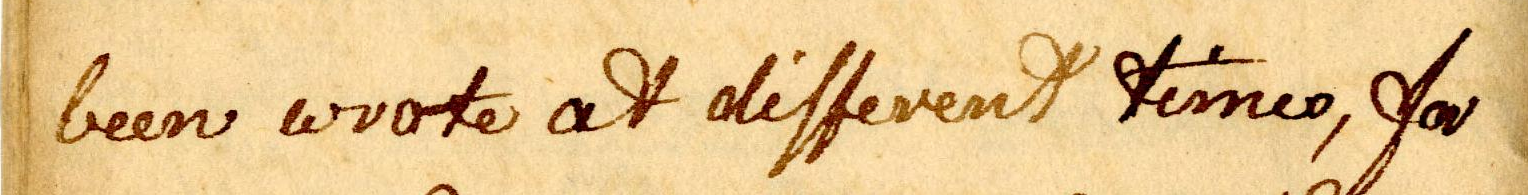been wrote at different times, for
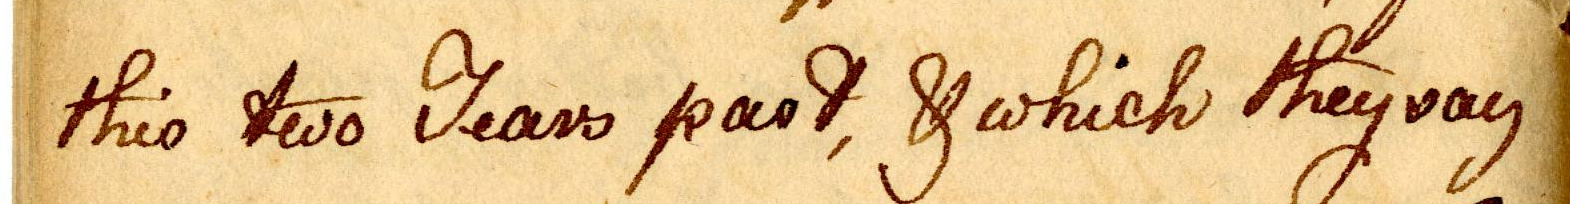this two Years past, & which they say
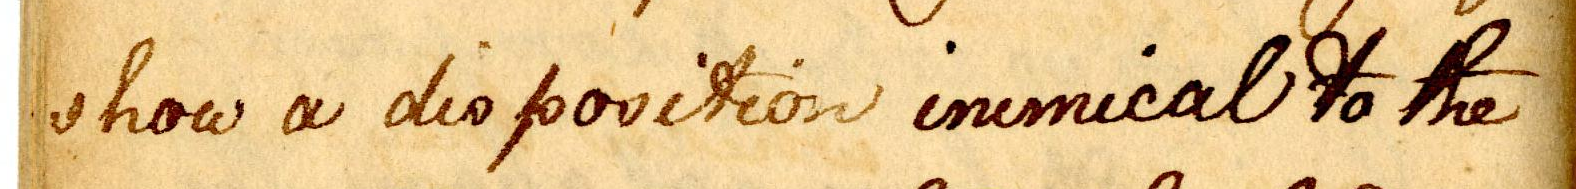show a disposition inemical to the
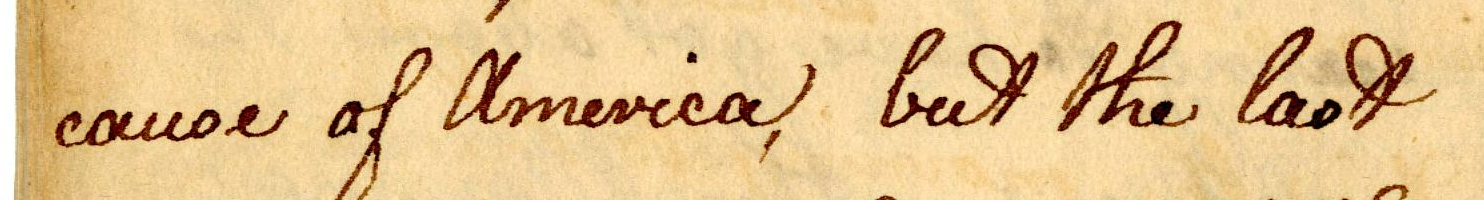cause of America, but the last
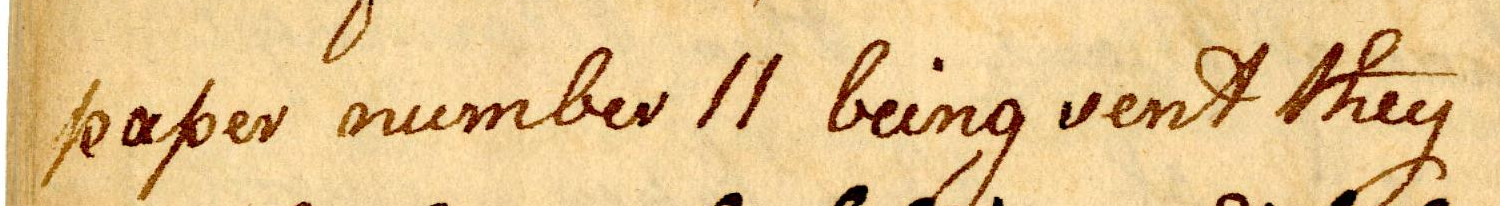paper number 11 being sent they
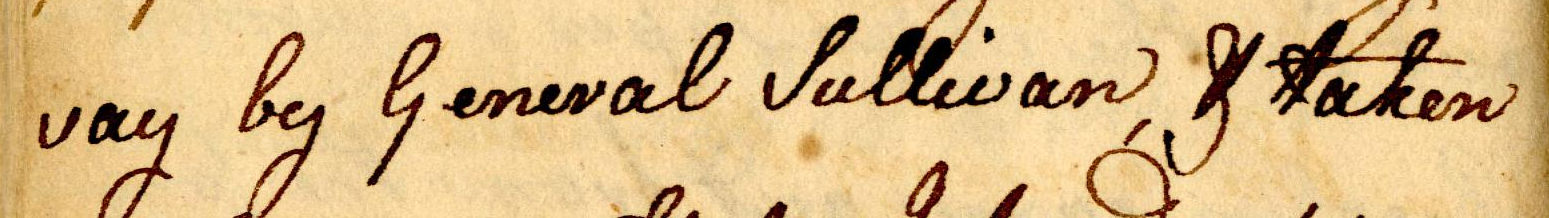say by General Sullivan, & taken
